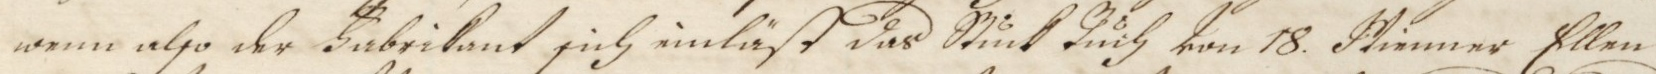wenn also der Fabrikant sich einläst das Stuck Tuch von 18. Wienner Ellen
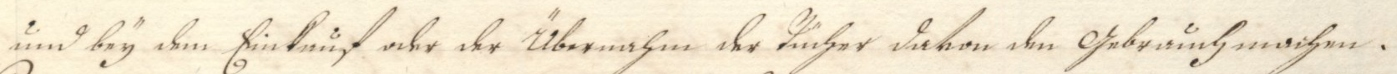und bey dem Einkauf oder der Übernahm der Tücher davon den Gebrauch machen.
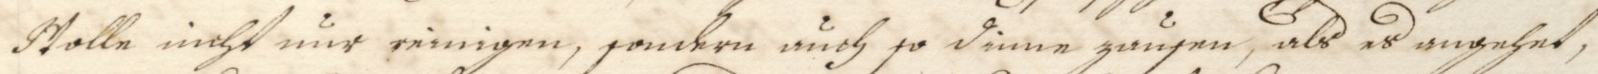Wolle nicht nur reinigen, sondern auch so dinne zausen, als es angehet,
